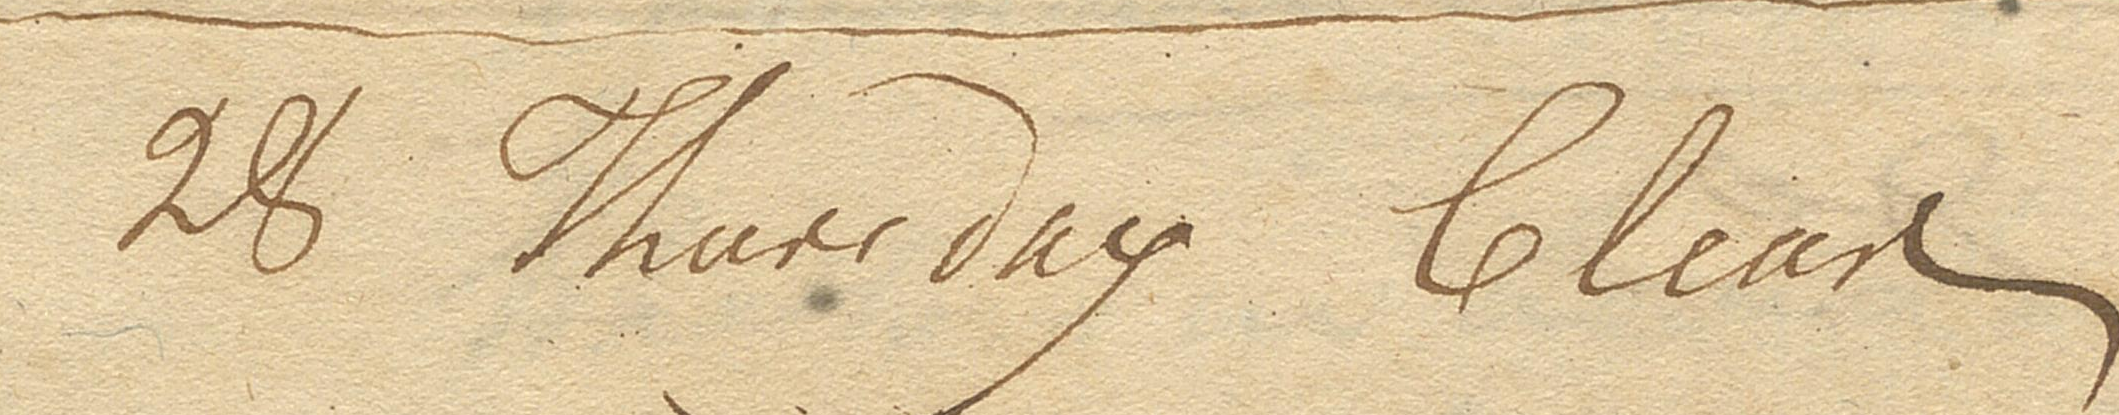28 Thursday Clear
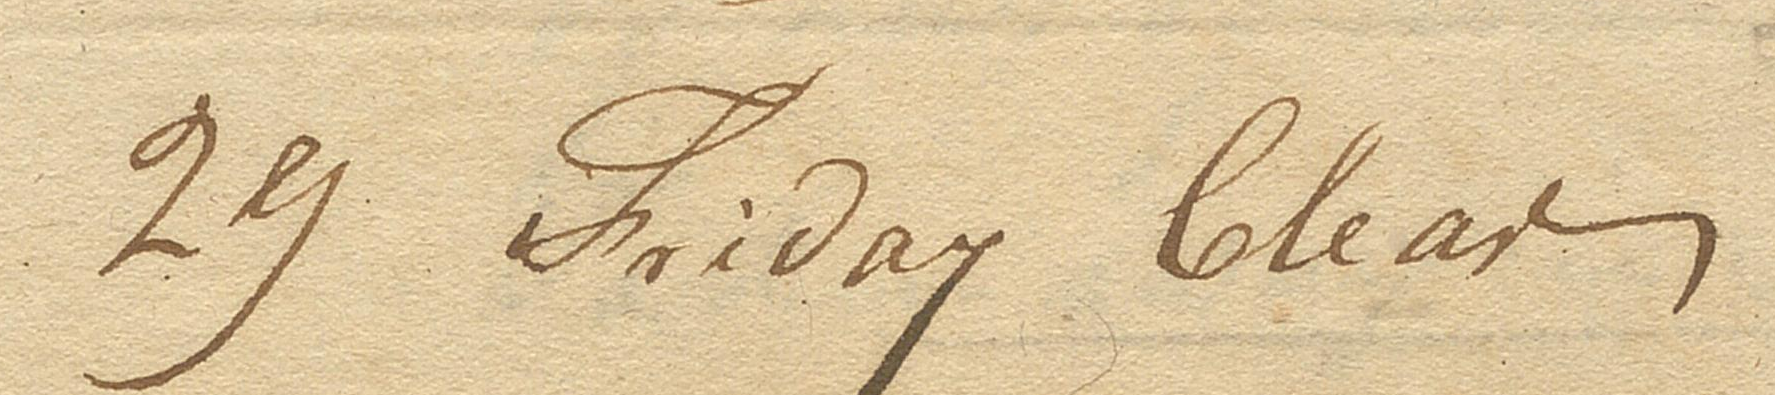29 Friday, Clear
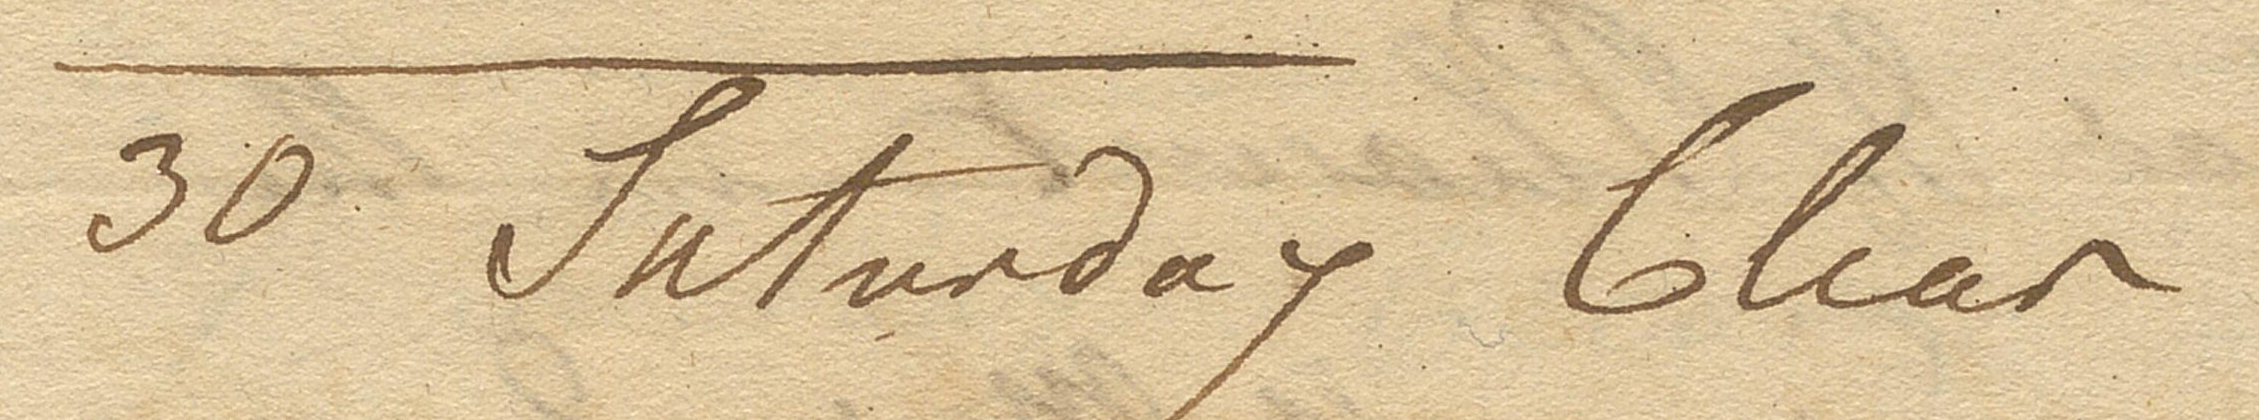30 Saturday Clear
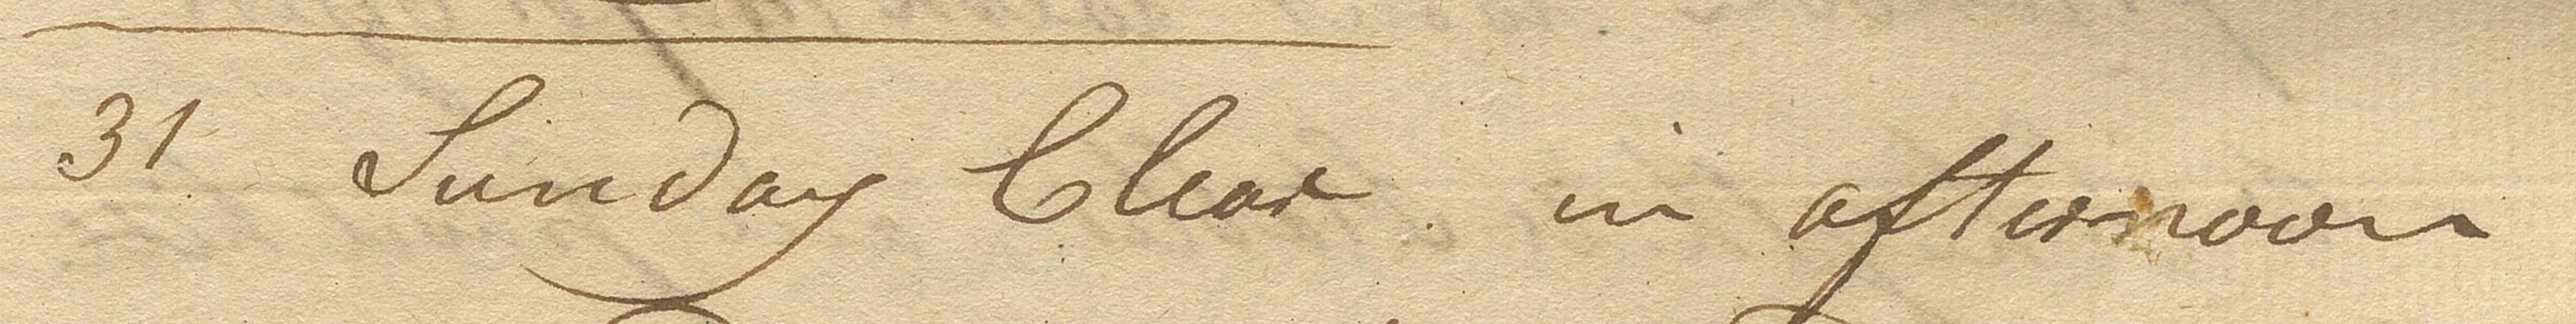31 Sunday Clear in afternoon
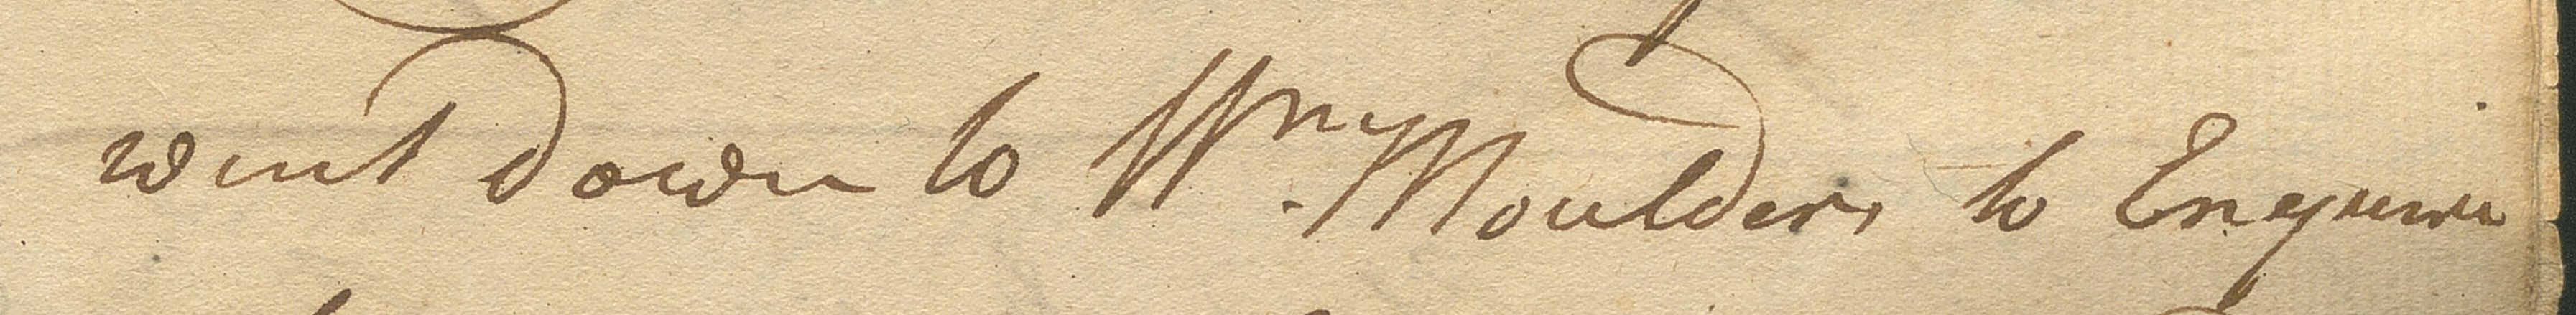went down to W^m. Moulders to Enquire
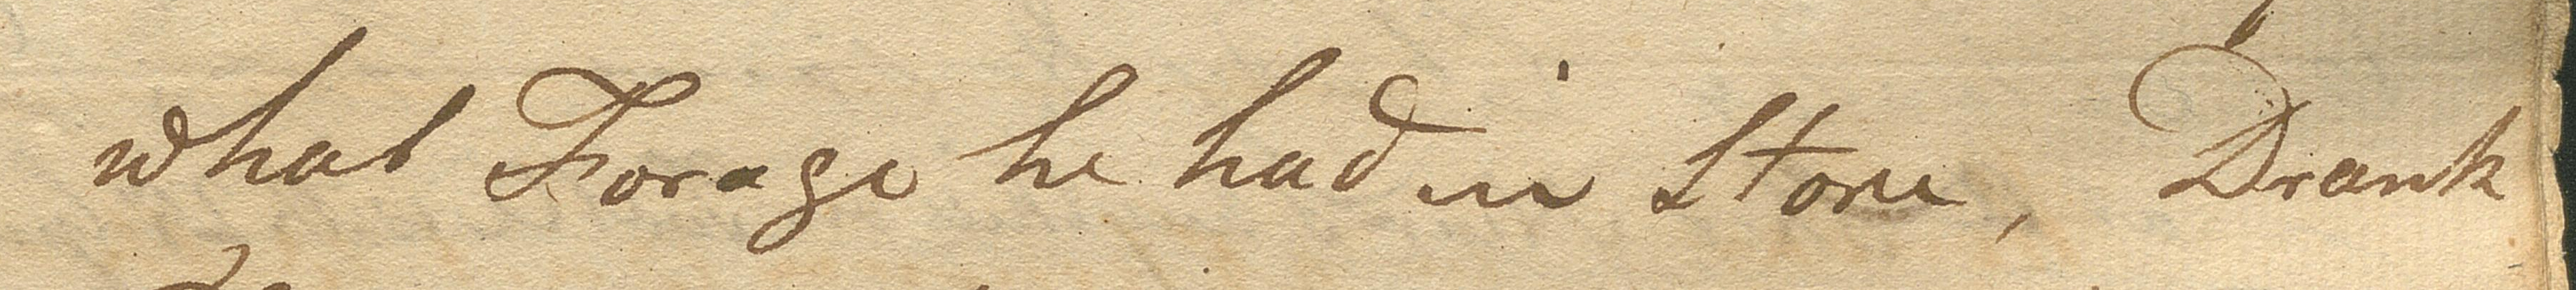what Forage he had in Store, Drank
